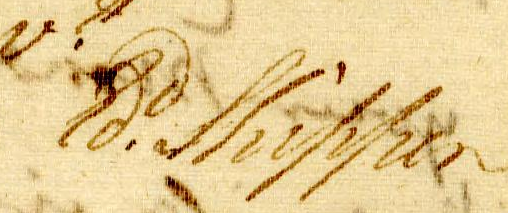Ed^d. Shippen
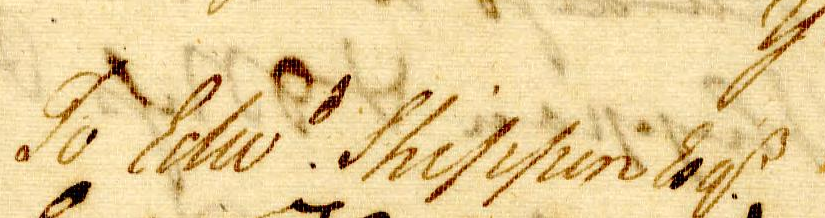To Edw^d. Shippen Esq^r.
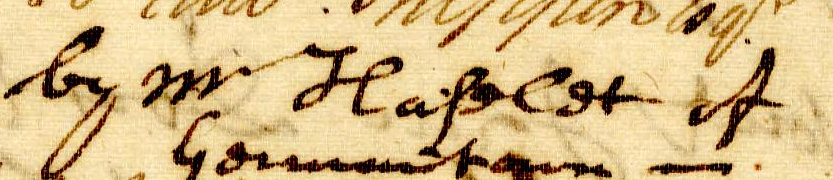by M^r Hasslet of
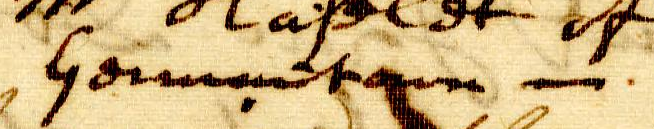Germantown-
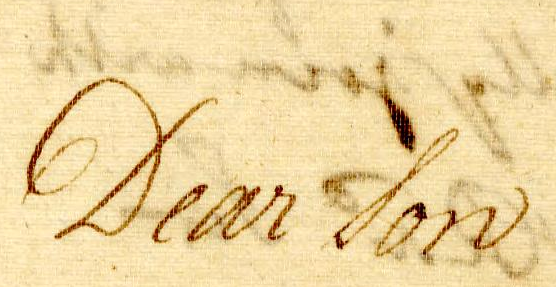Dear Son by Mr Hasslet
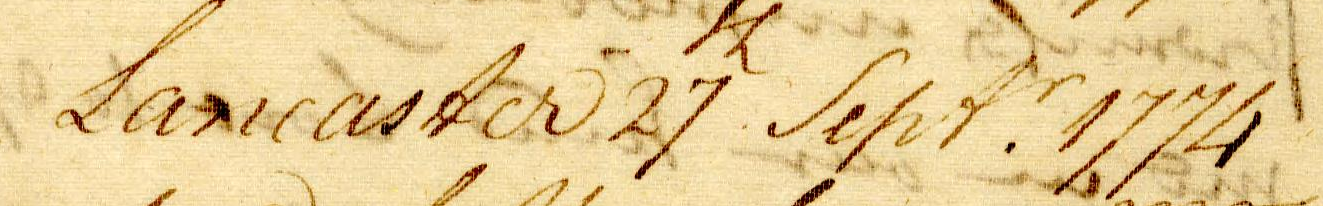Lancaster 27^th Sept^r. 1774
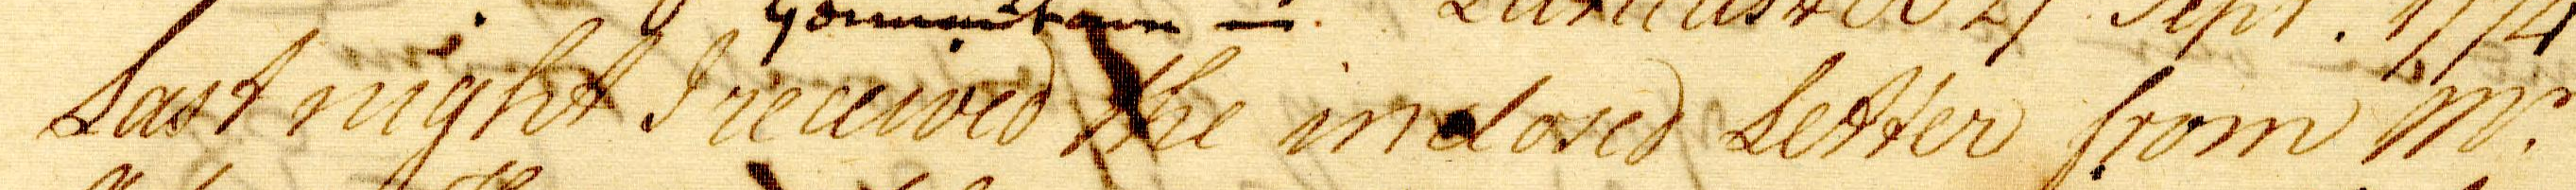Last night I received he inclosed Letter from M^r.
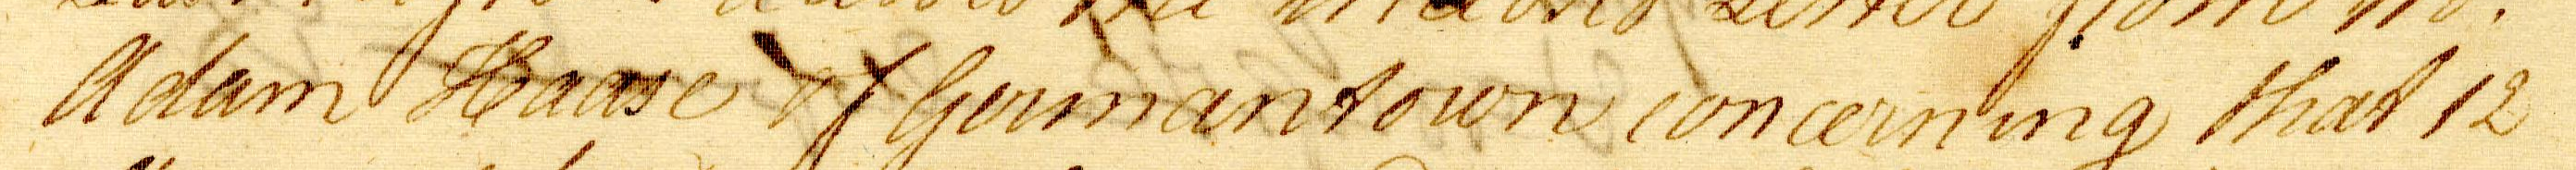Adam Haase of Germantown concerning that 12
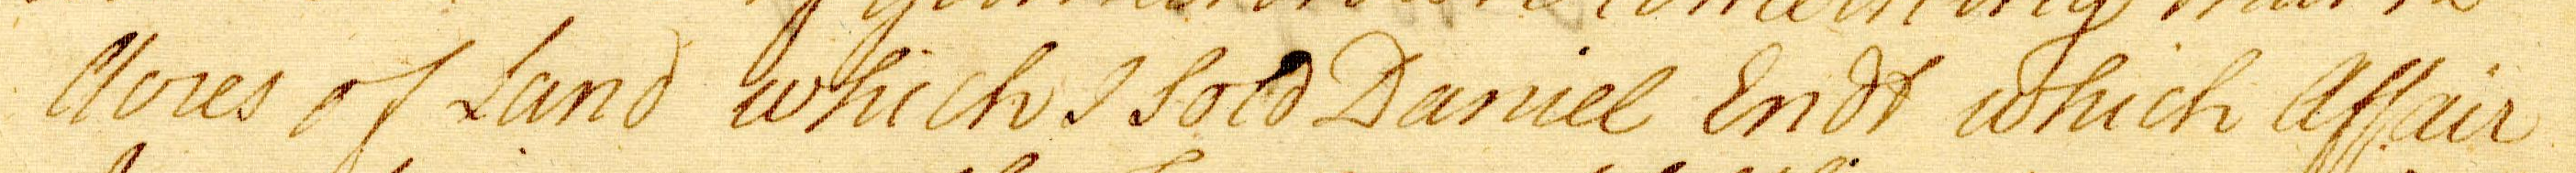Acres of Land which I Sold Daniel Endt which Affair
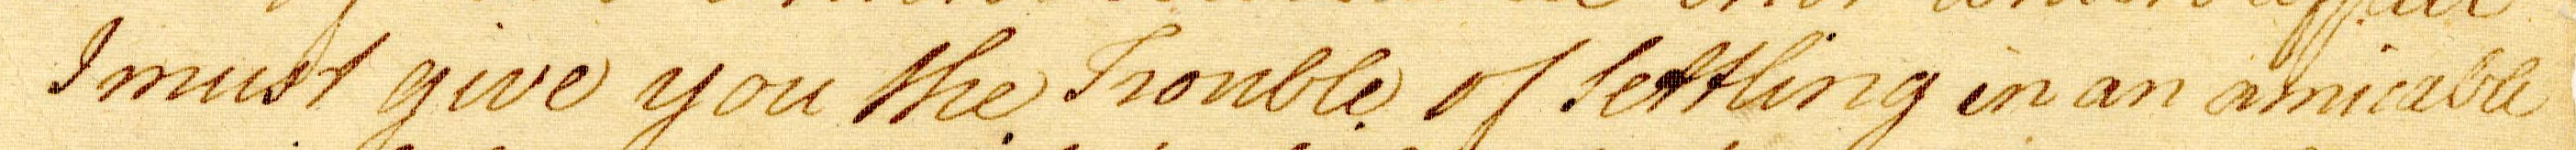I must give you the Trouble of Settling in an amicable
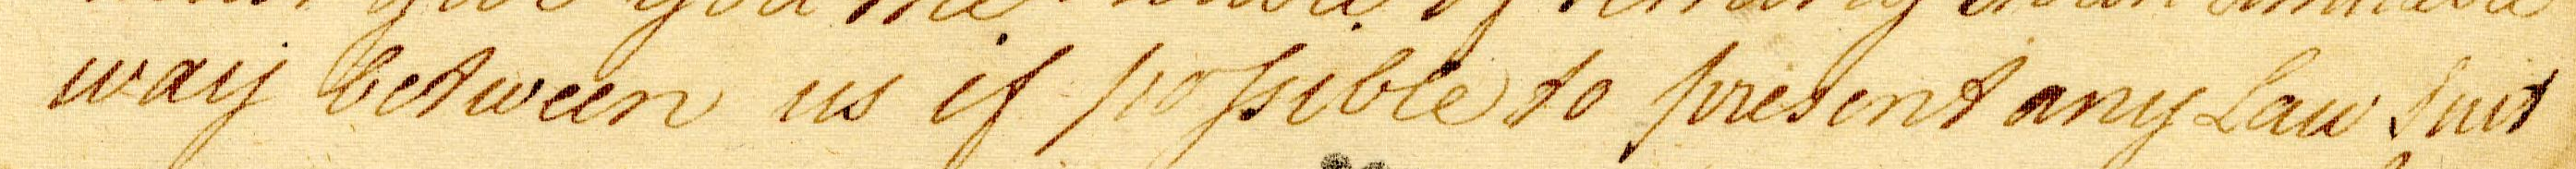way between us if possible to present ay Law Init
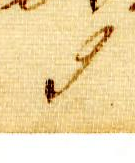I
